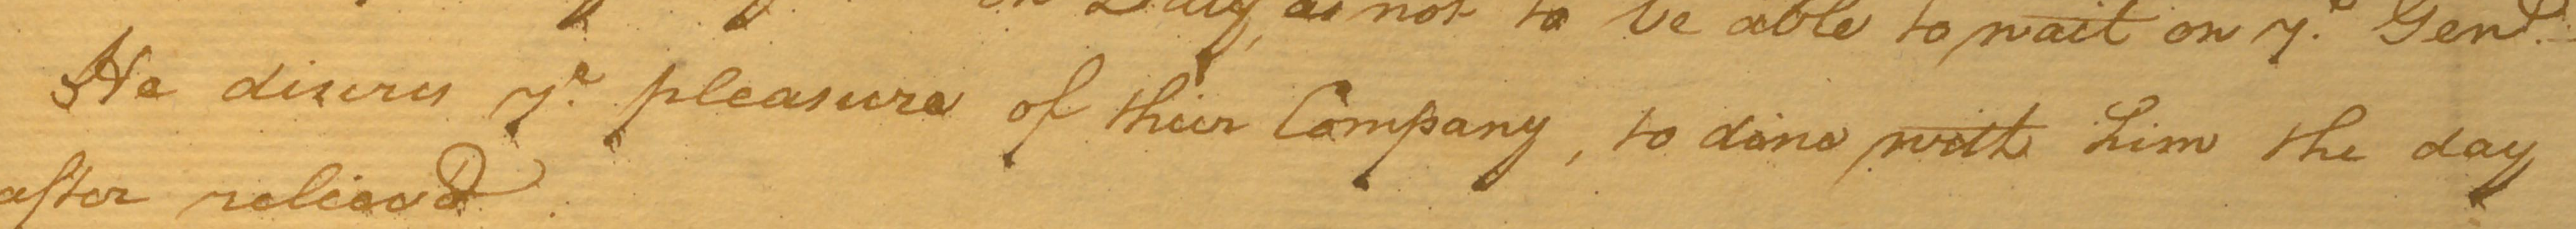He disires y^e. pleasure of their Company, to dine with him the day
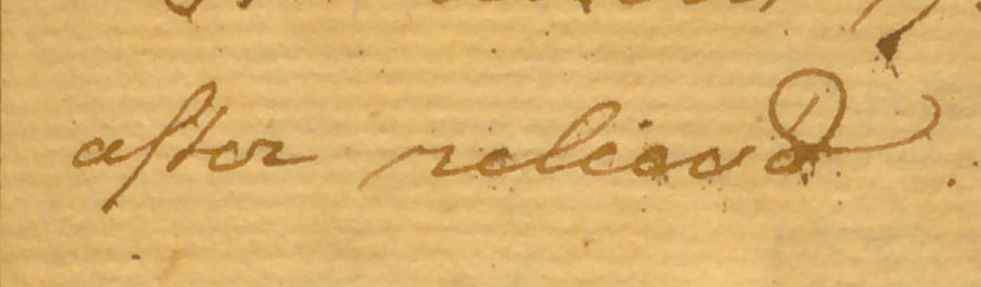after reliev'd
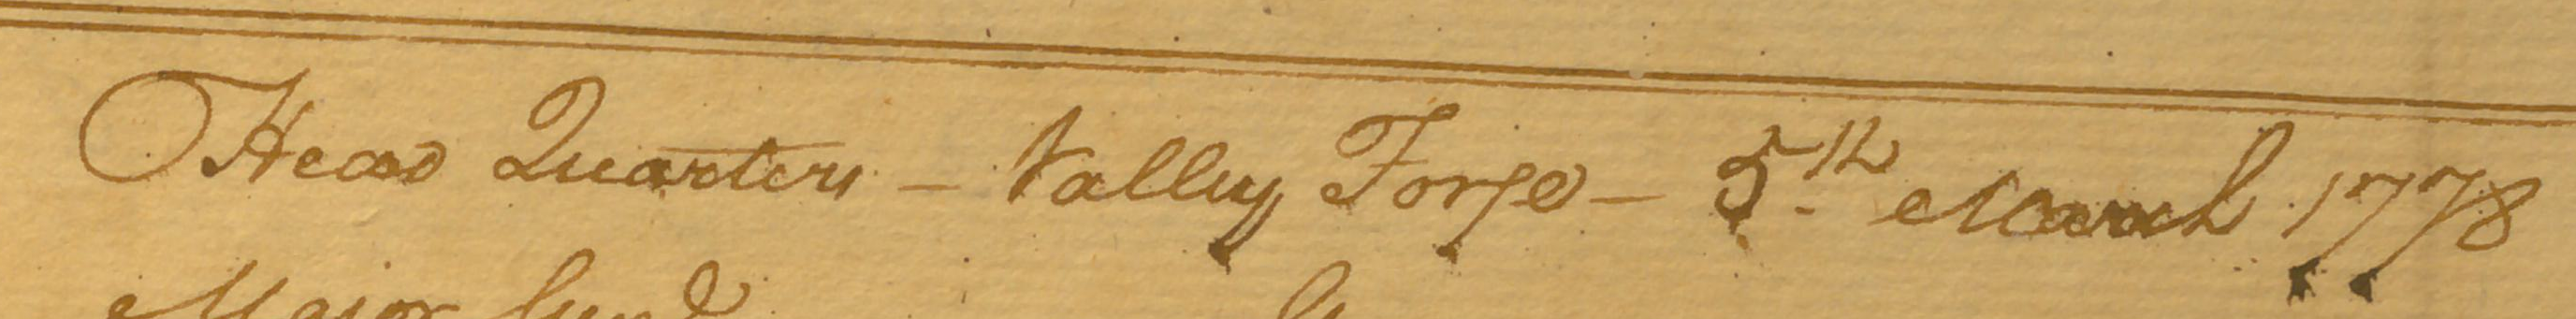Head Quarters- Valley Forge 5^th. March 1778
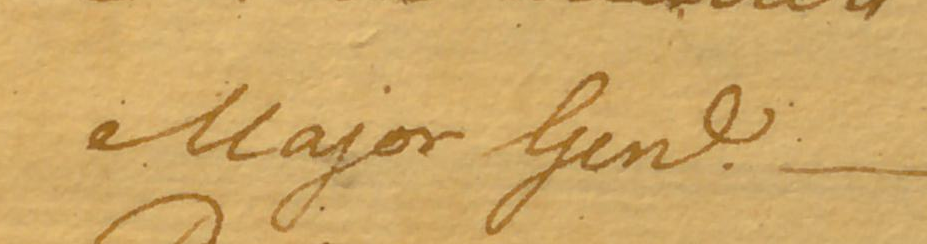Major Gen^l.-
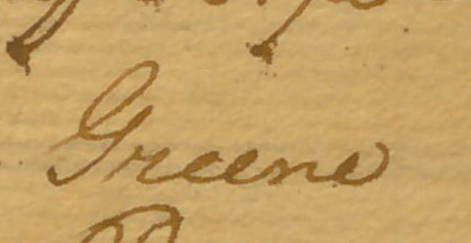-Greene
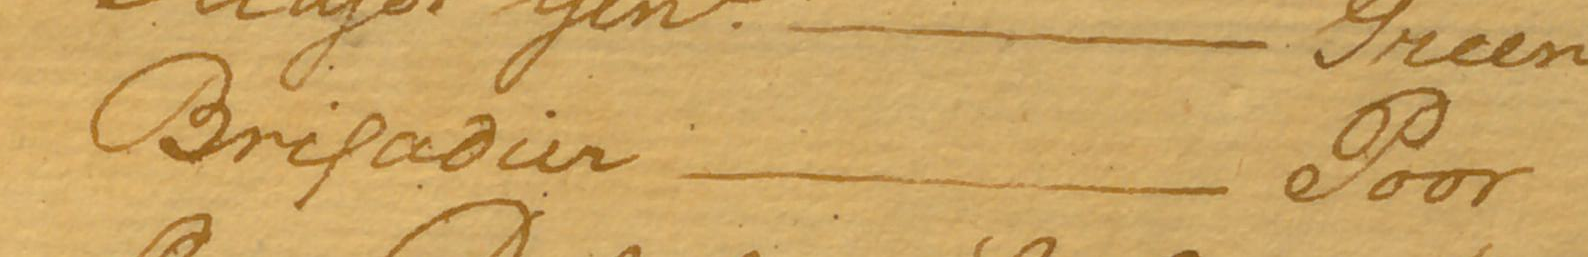Brigadier- Poor
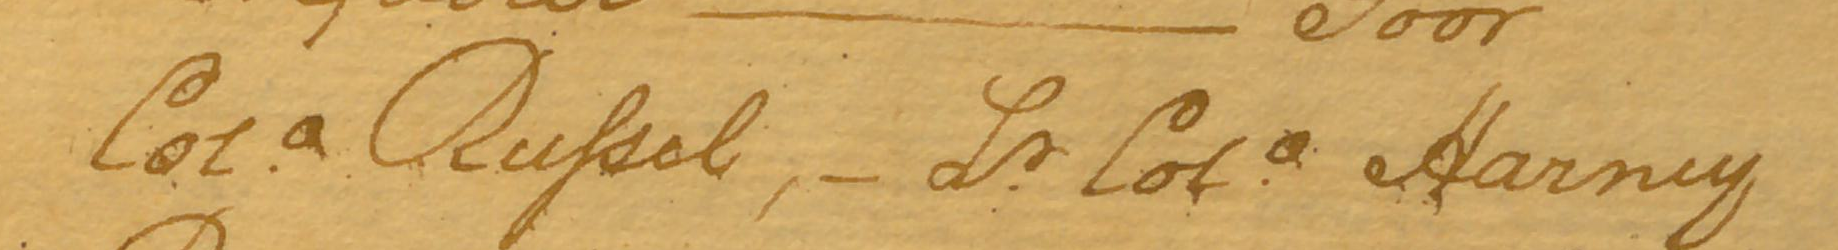Col^o. Russel,- L^t. Col^o. Harney
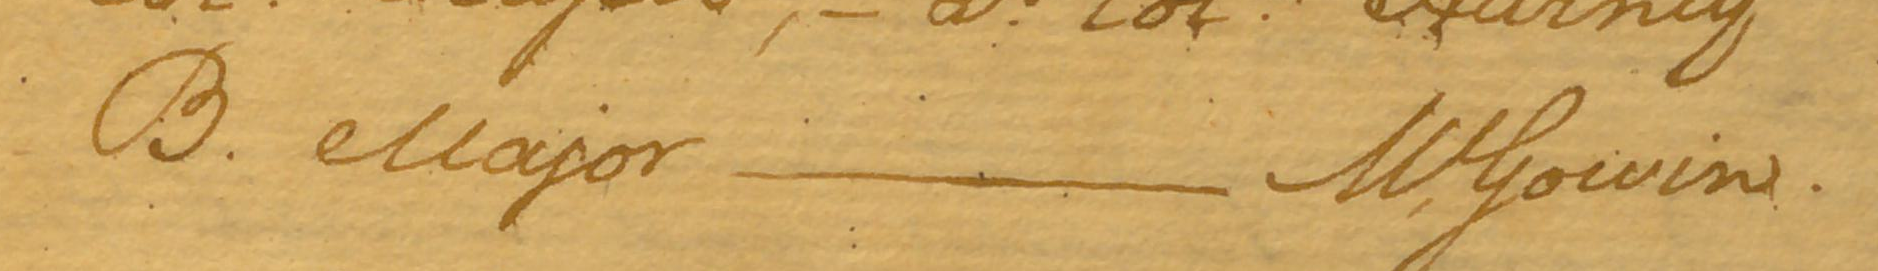B. Major- M^c.Gowin.
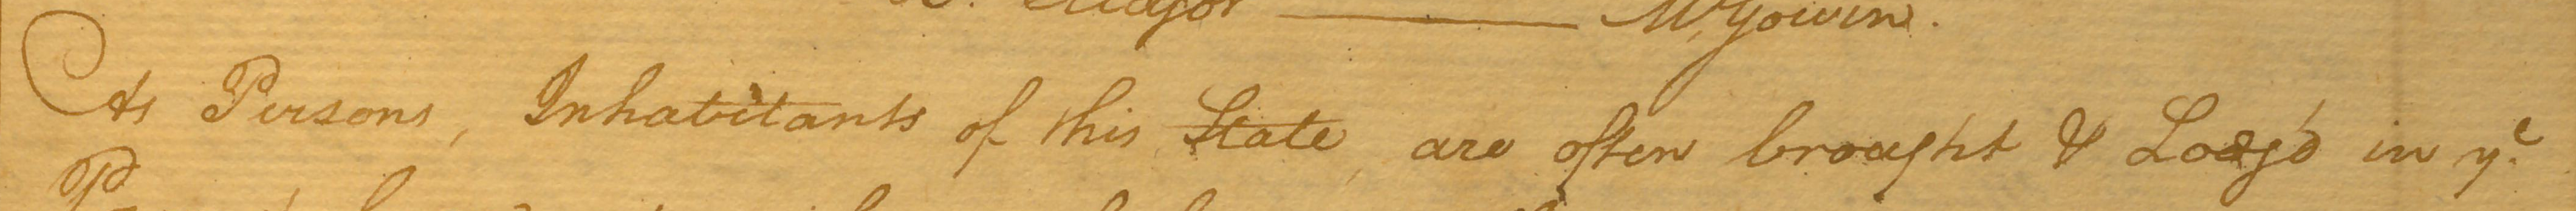As Persons, Inhabitants of this State are often brought & Lodg'd in y^e.
